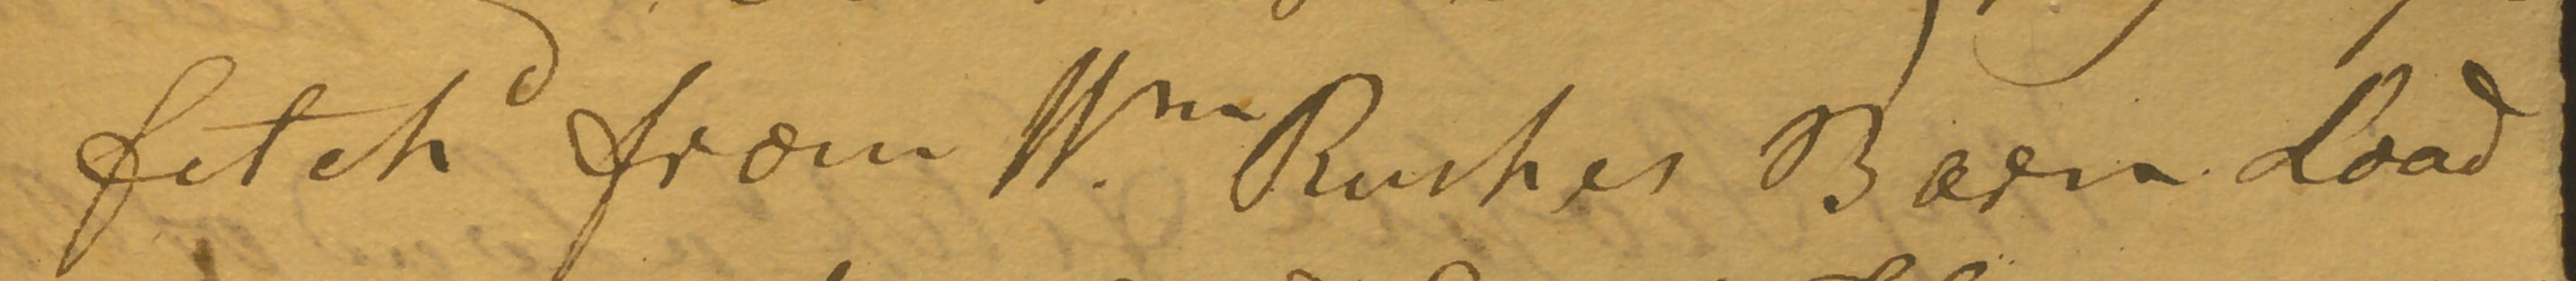fetch^d from W^m. Rushes Barn Load
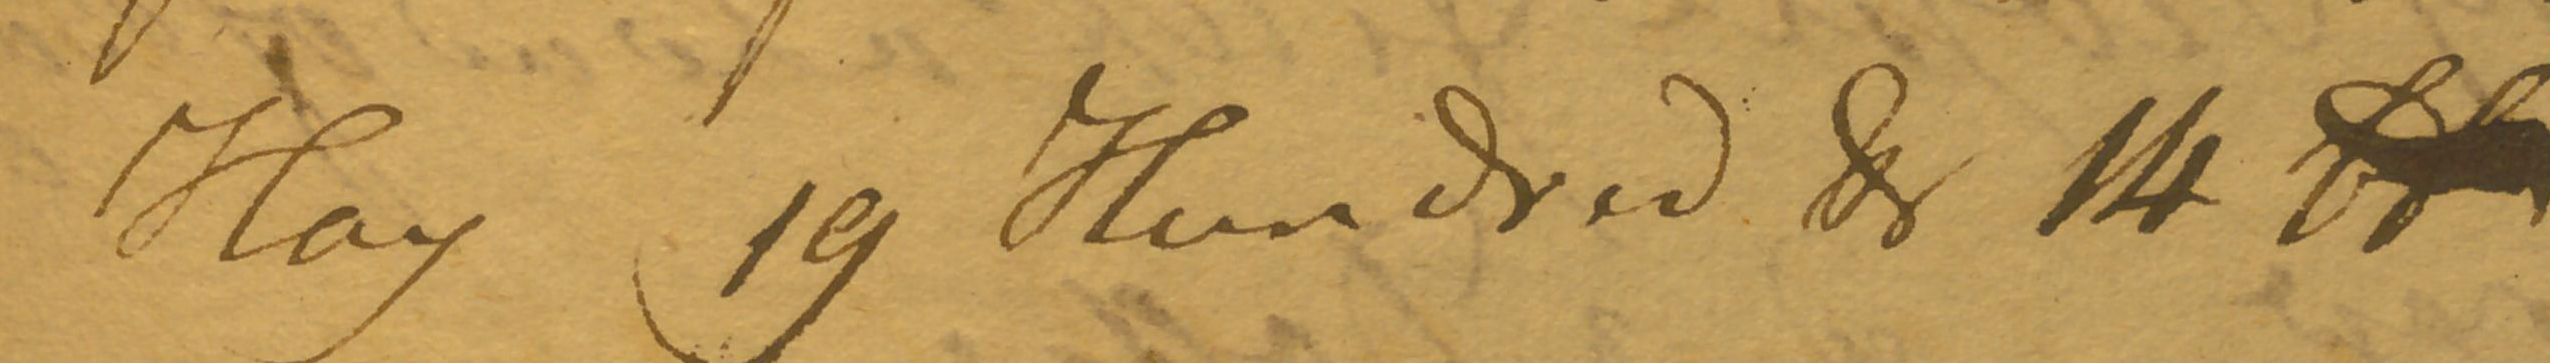Hay 19 Hundred & 14 lb
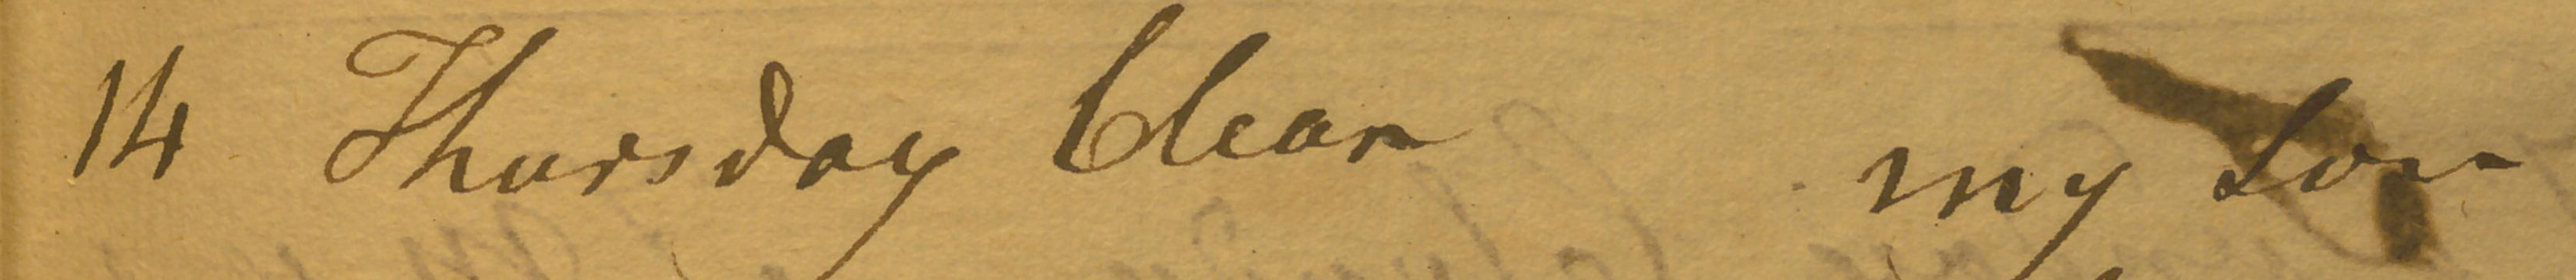14 Thursday Clear my son
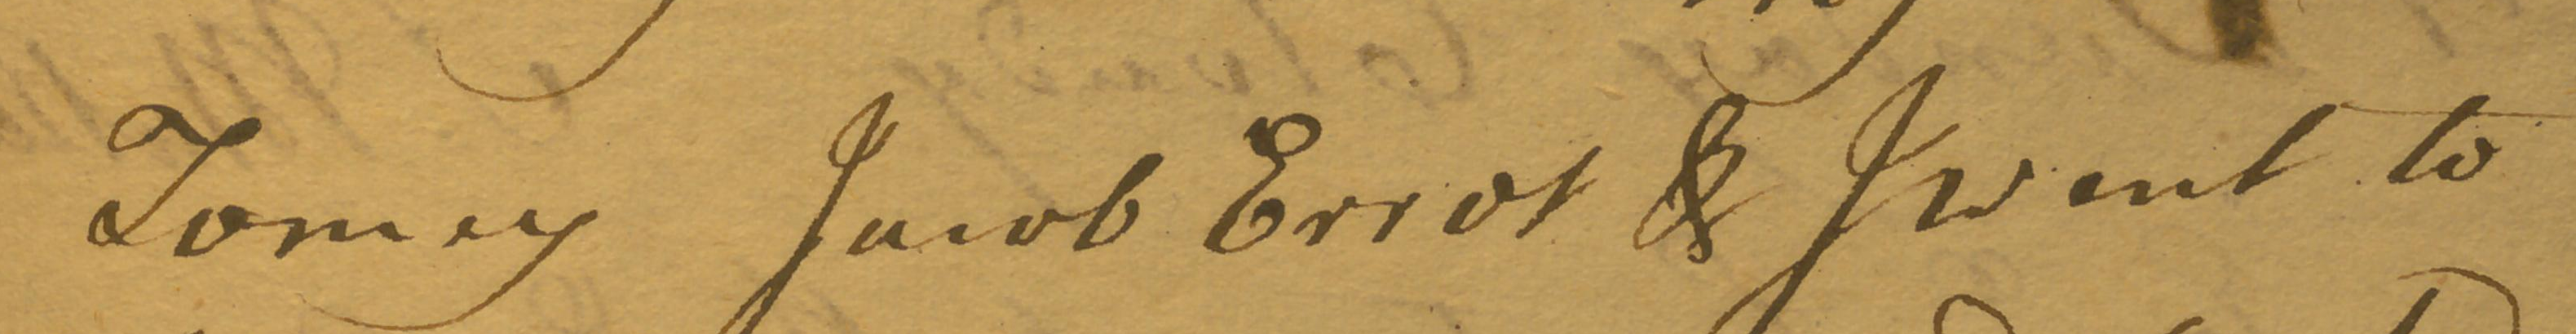Tomey Jacob Errot & I went to
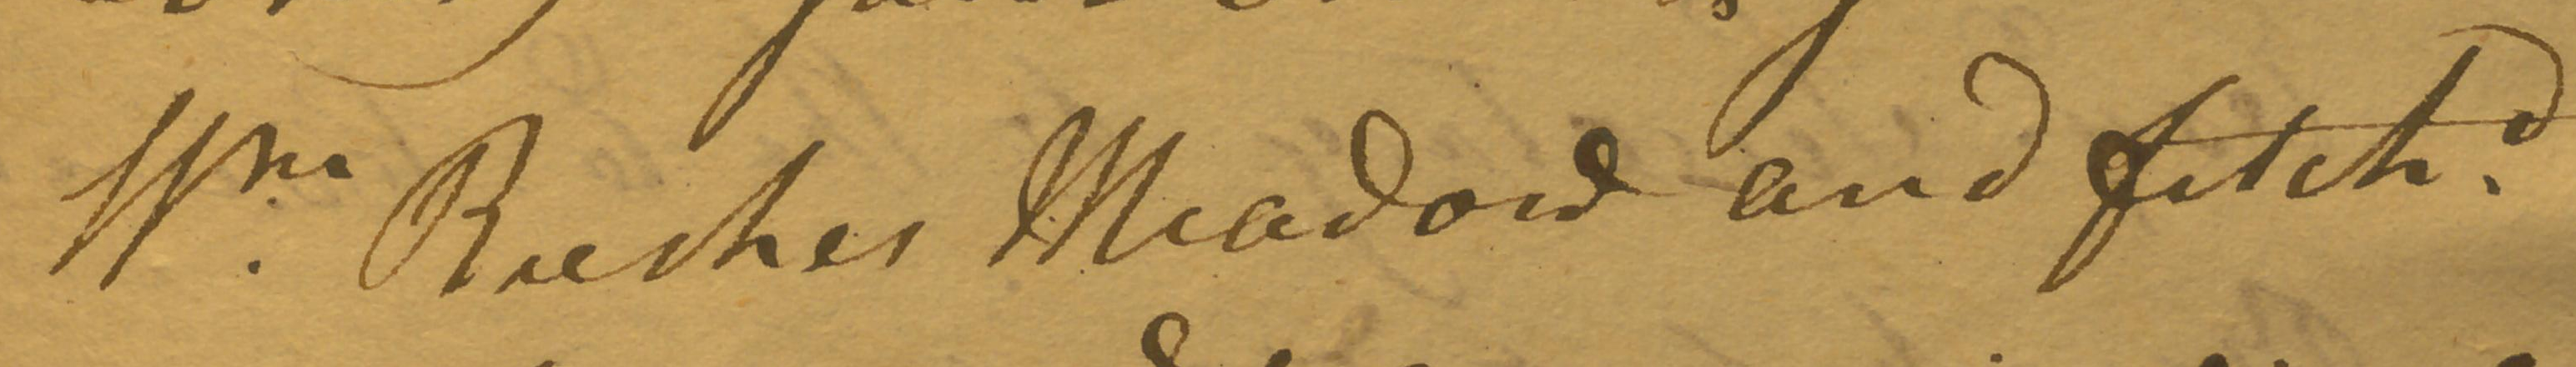W^m. Rushes Meadow and fetch^d.
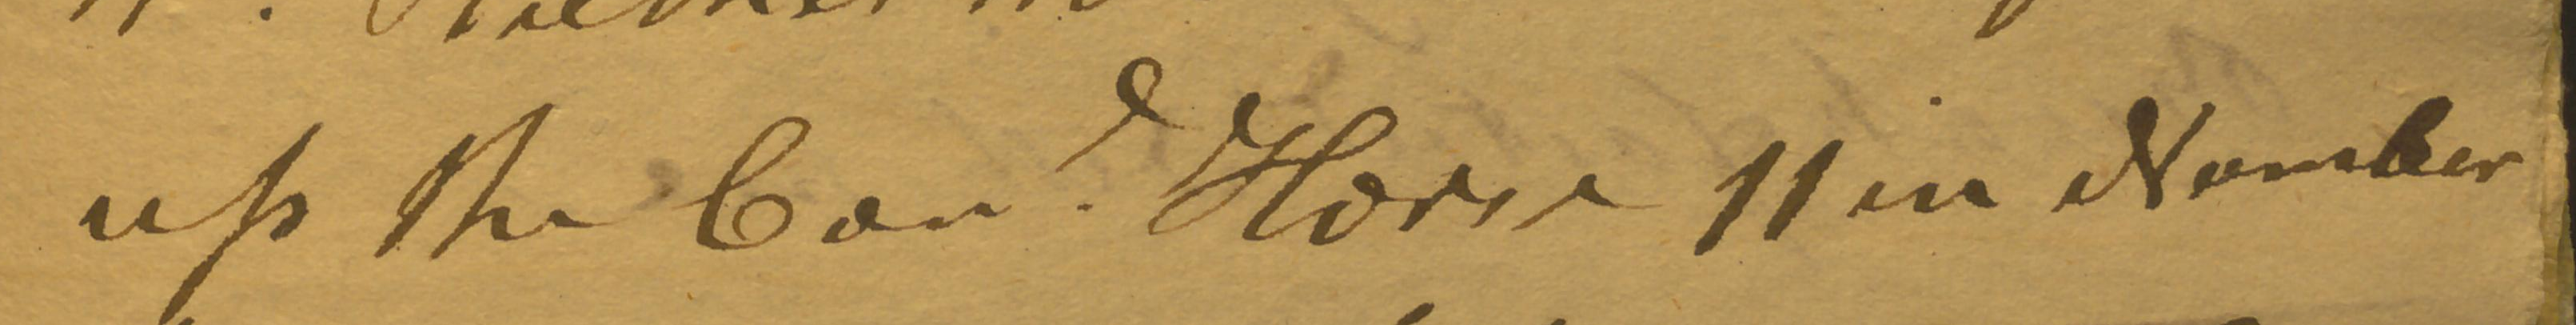up the Con^l. Horse 11 in Number
